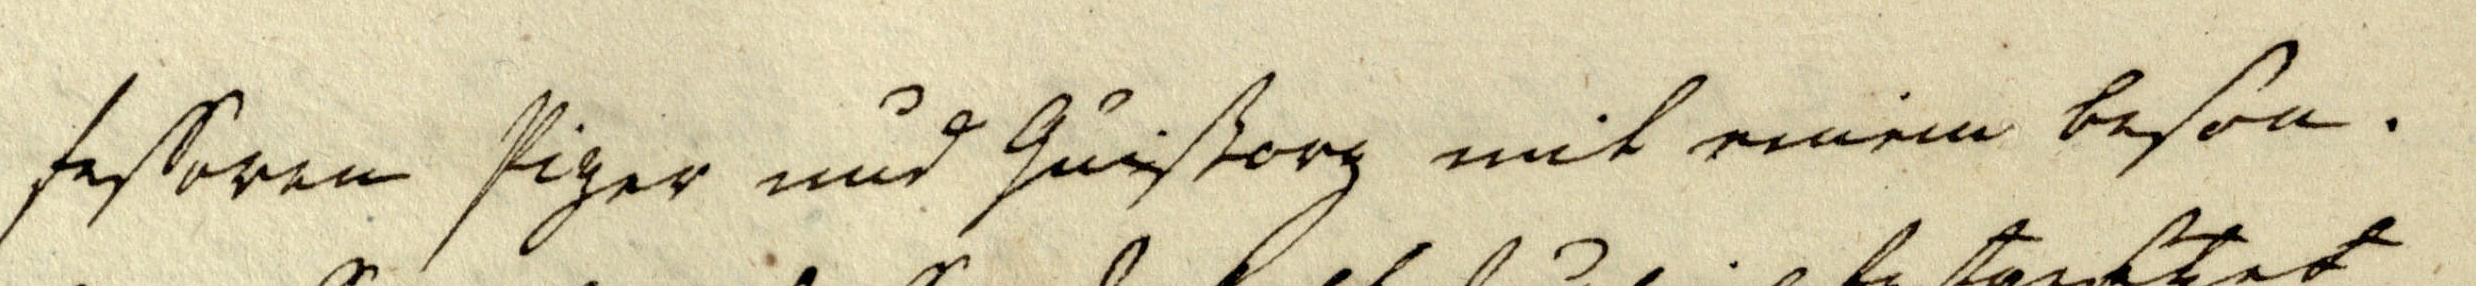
fessoren Piper und Quistorp mit einem beson¬
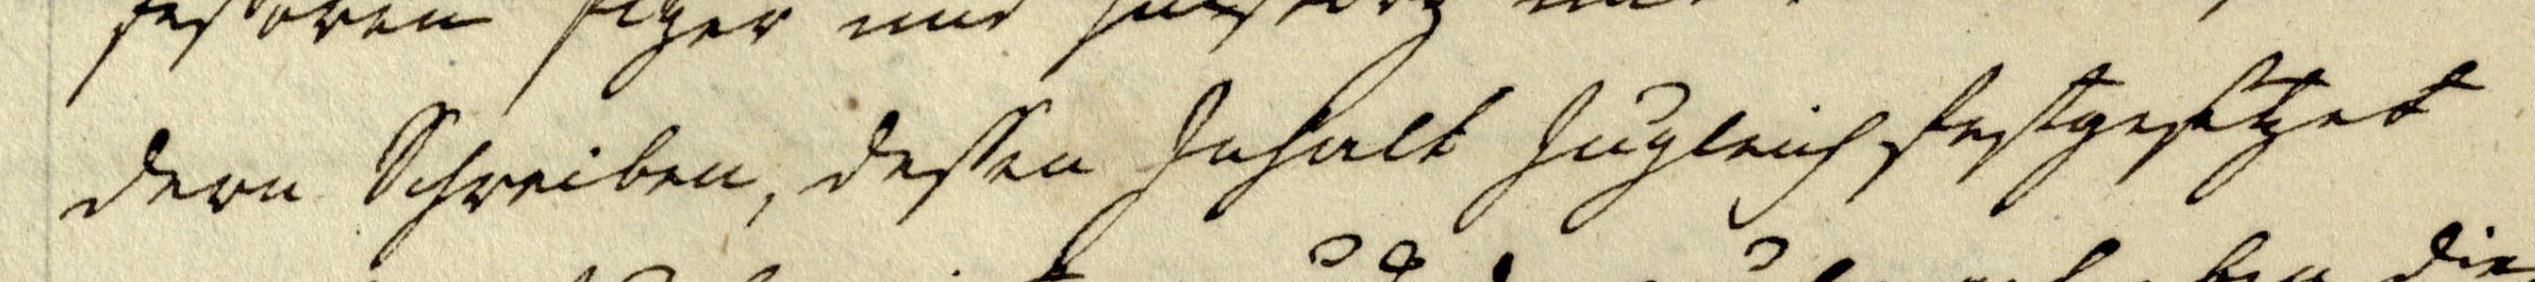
dern Schreiben, dessen Inhalt zugleich festgesetzet
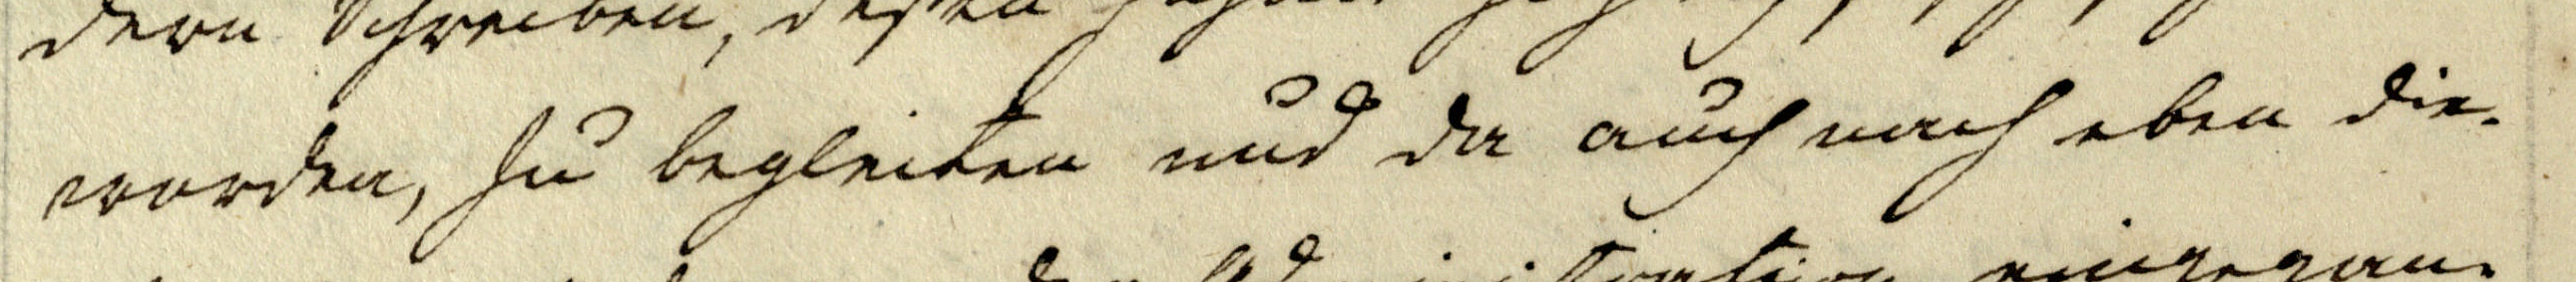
worden, zu begleiten und da auch nach eben die¬
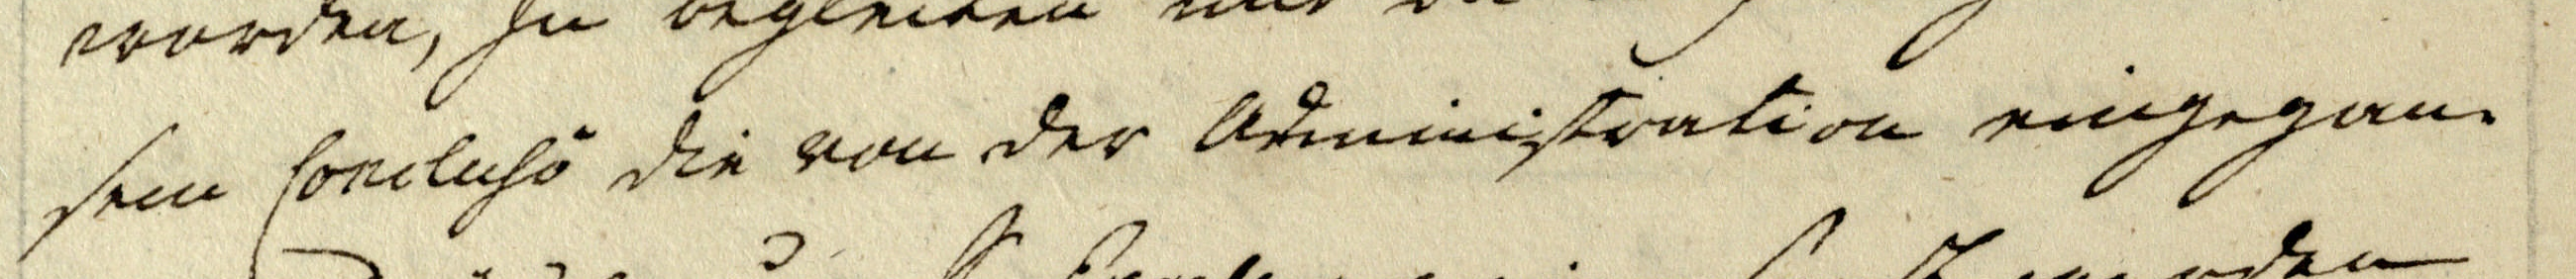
sem Concluso die von der Administration eingegan¬
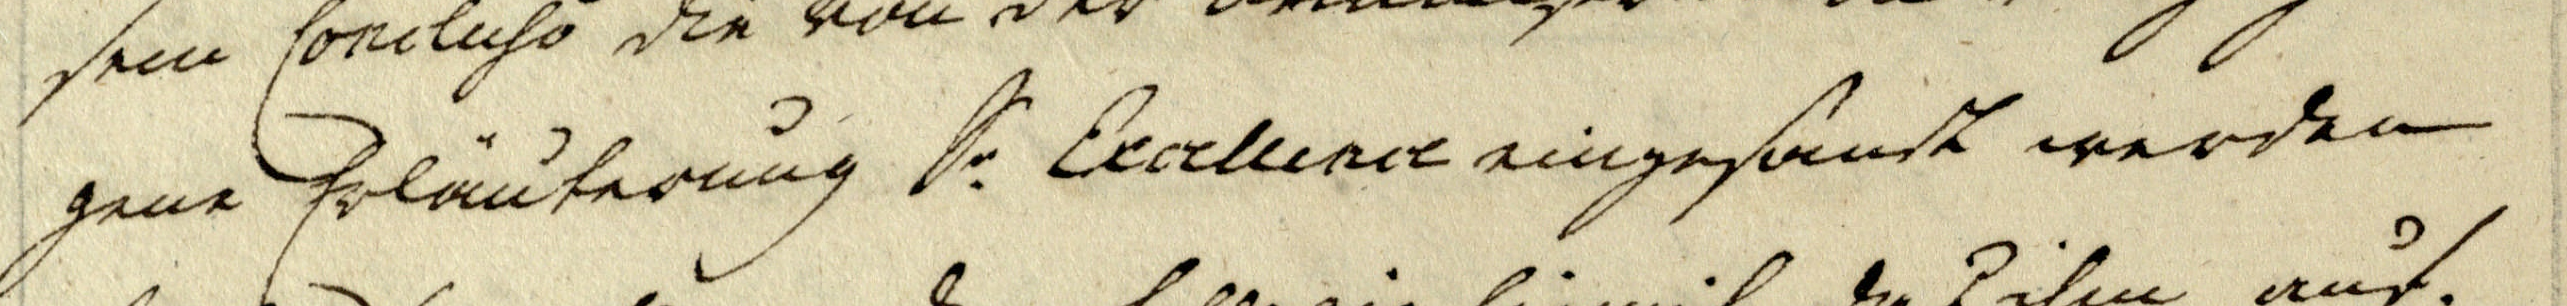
gene Erläuterung Sr Excellence eingesandt werden
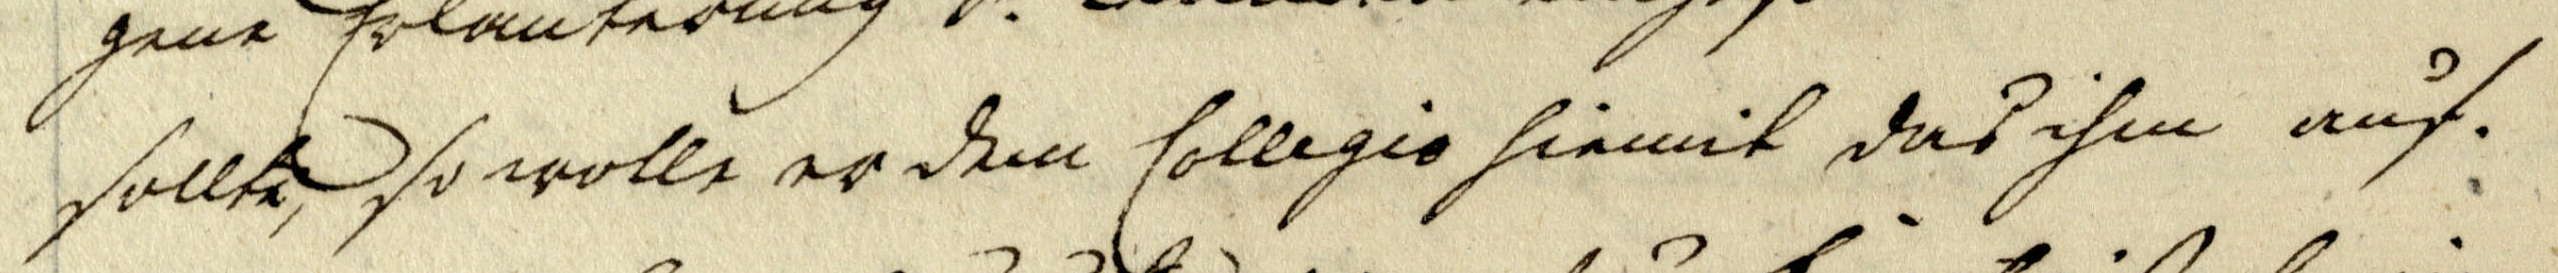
sollte, so wolle er dem Collegio hiemit das ihm auf¬
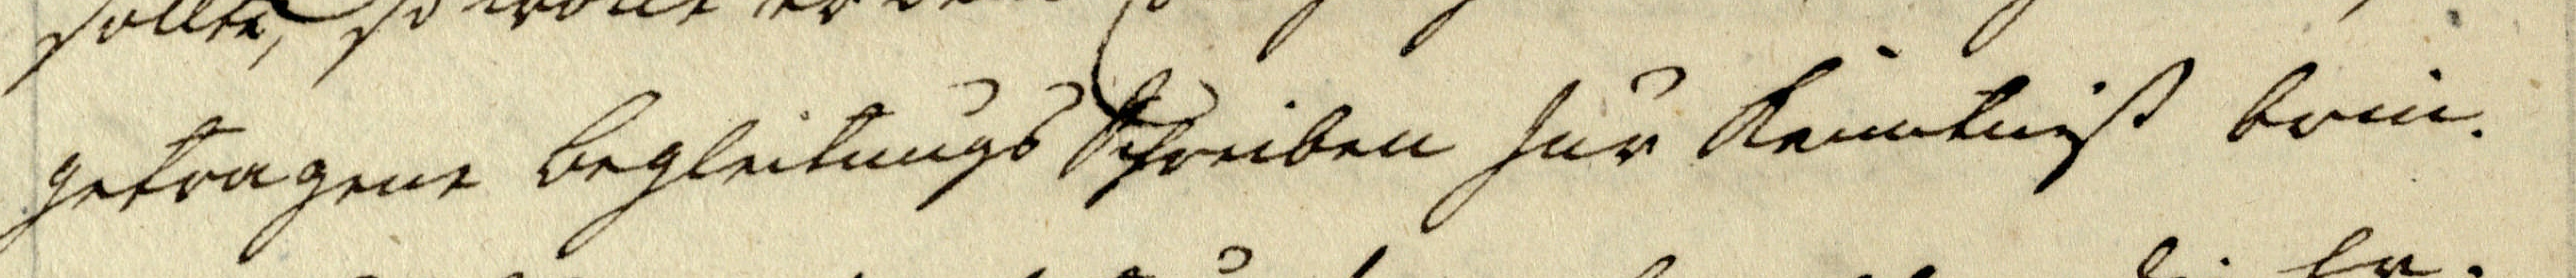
getragene Begleitungs Schreiben zur Kenntniß brin¬
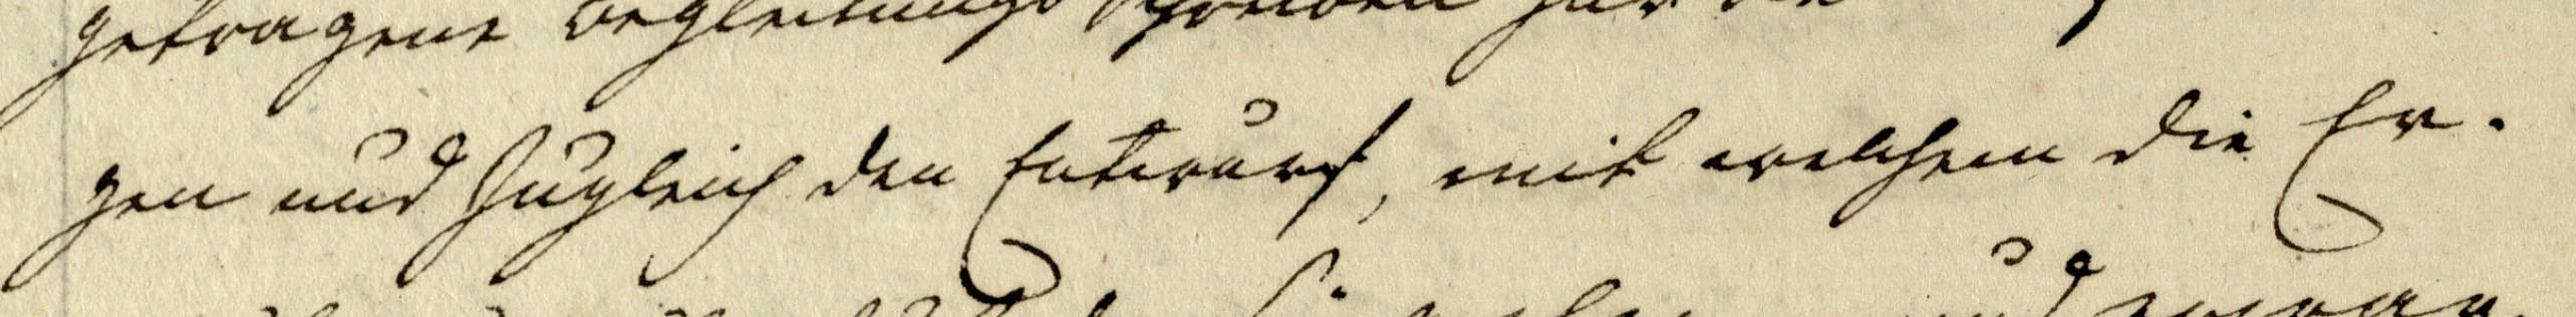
gen und zugleich den Entwurf, mit welchem die Er¬
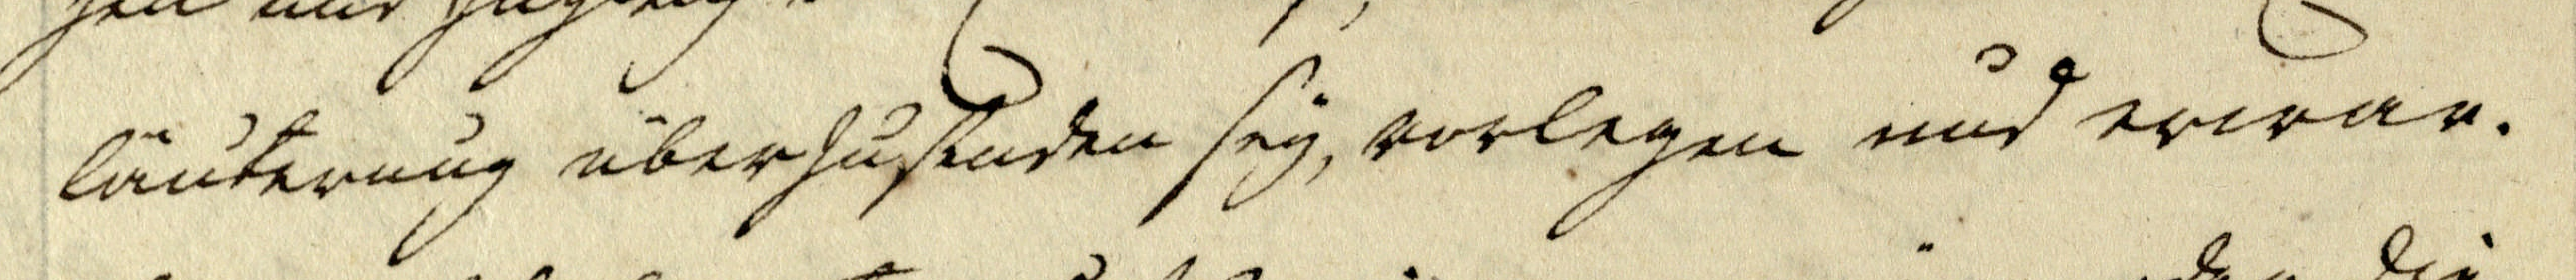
läuterung überzusenden seÿ, vorlegen und erwar¬
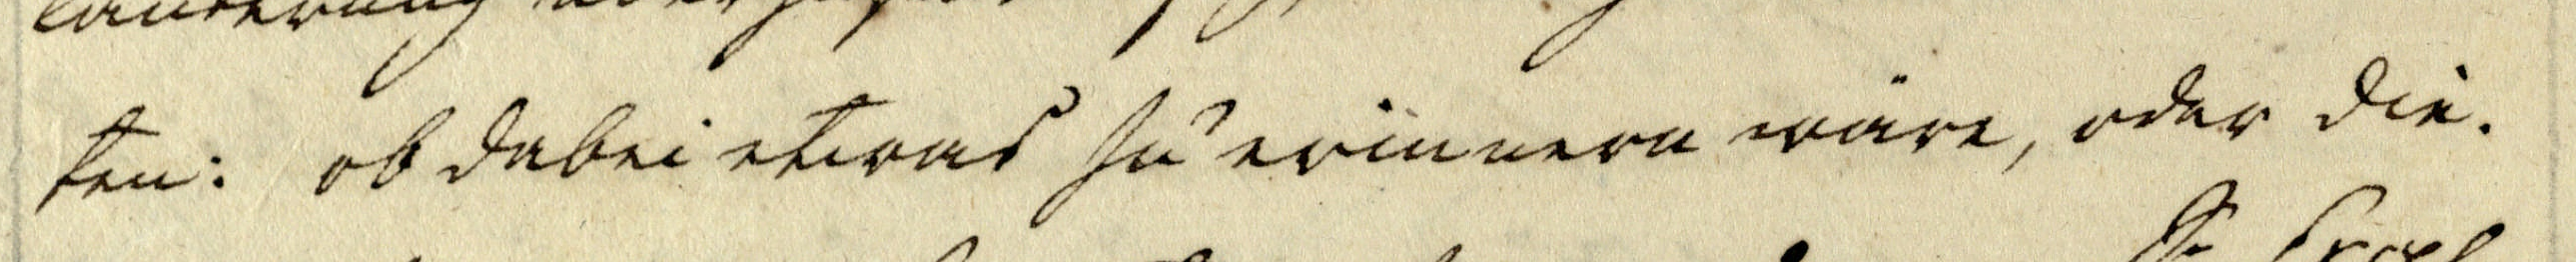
ten: ob dabei etwas zu erinnern wäre, oder die¬
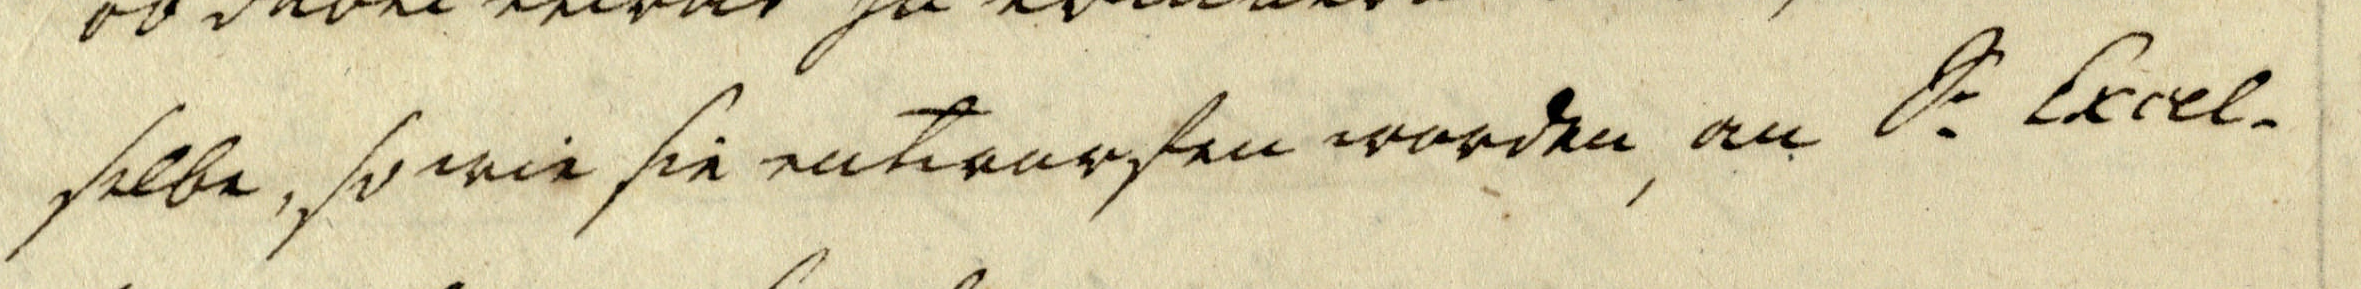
selbe, so wie sie entworfen worden, an Sr Excel¬
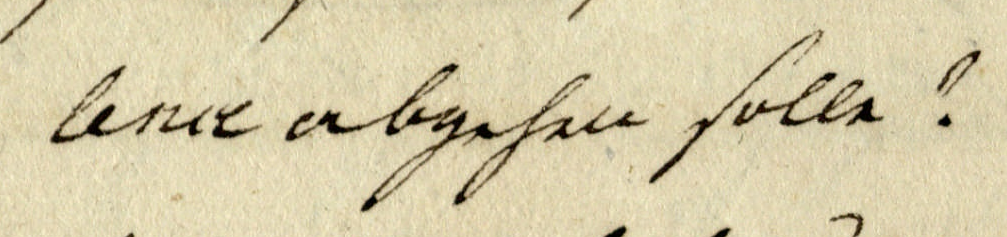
lence abgehen solle?
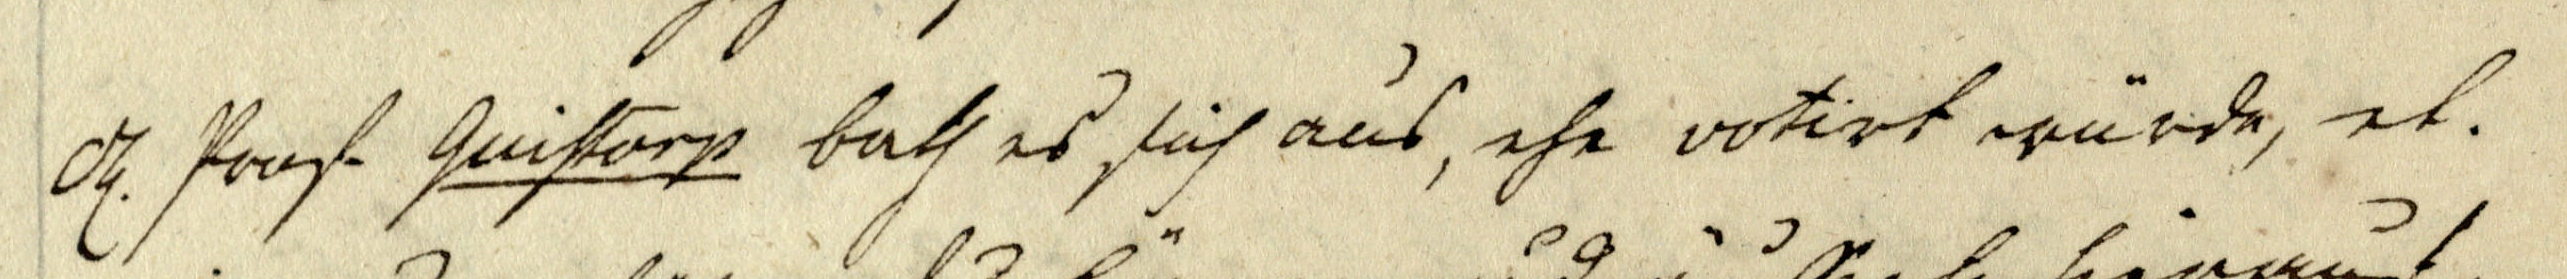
dh. Prof. Quistorp bath es sich aus, ehe votirt würde, et¬
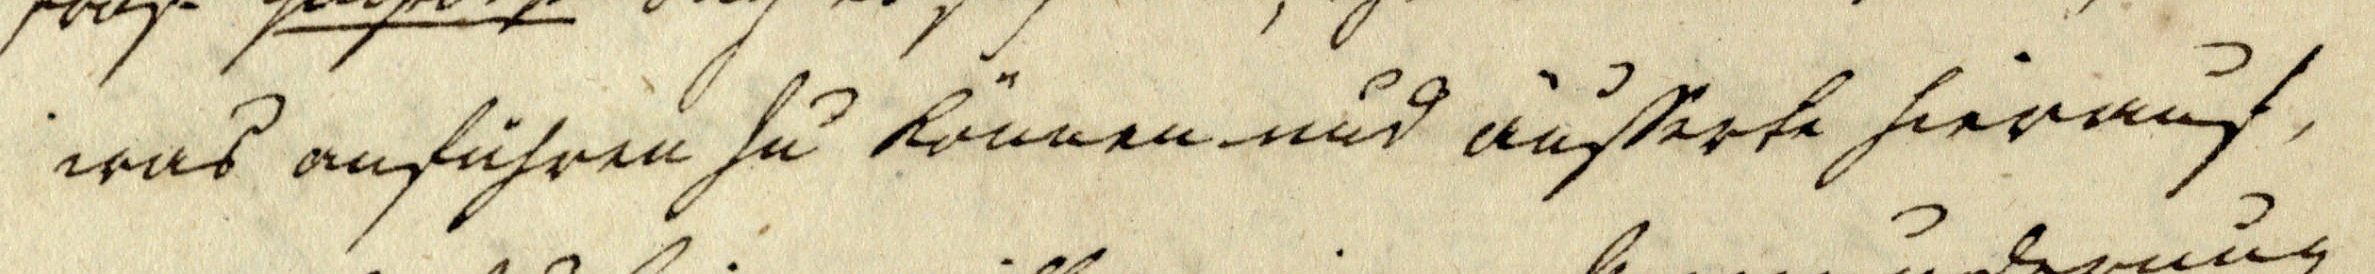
was anführen zu können und äusserte hierauf,
